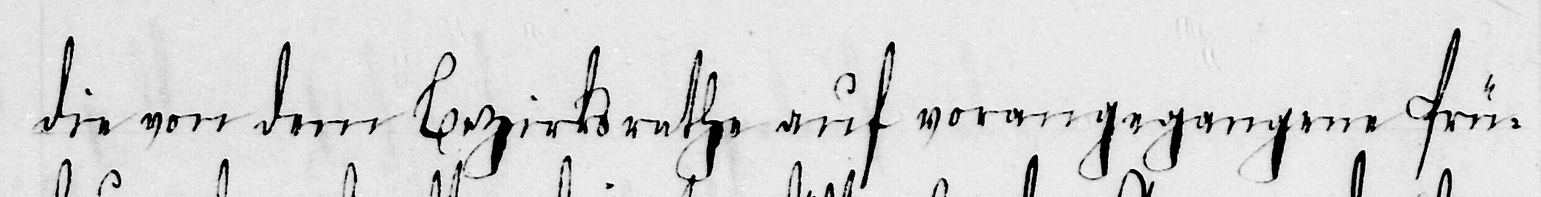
die von dem Bezirksrathe auf vorangegangene Prü¬
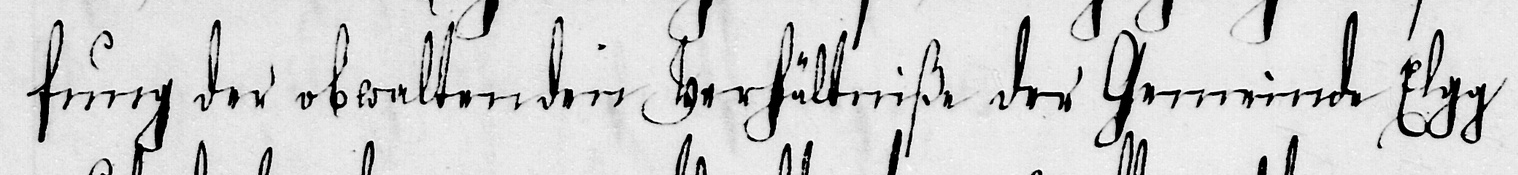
fung der obwaltenden Verhältniße der Gemeinde Elgg
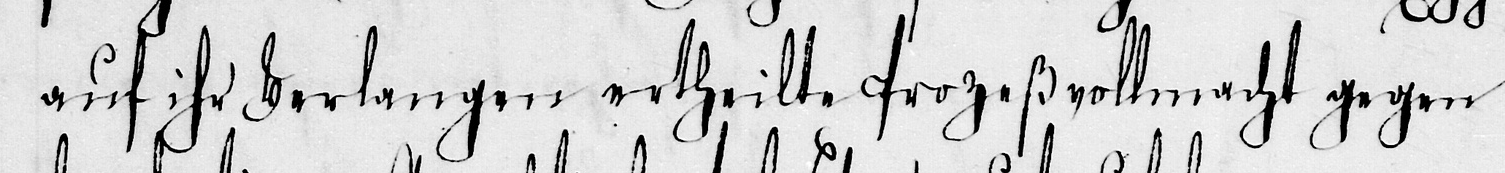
auf ihr Verlangen ertheilte Prozeßvollmacht gegen
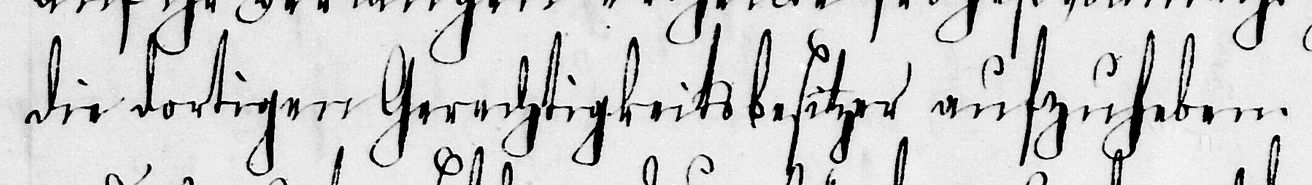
die dortigen Gerechtigkeitsbesitzer aufzuheben.
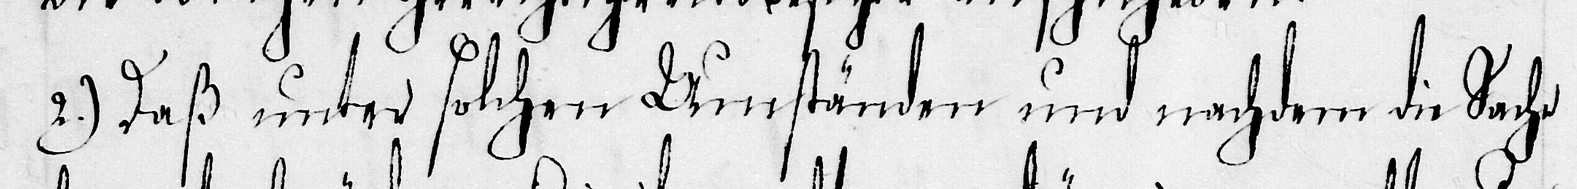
2.) Daß unter solchen Umständen und nachdem die Sache
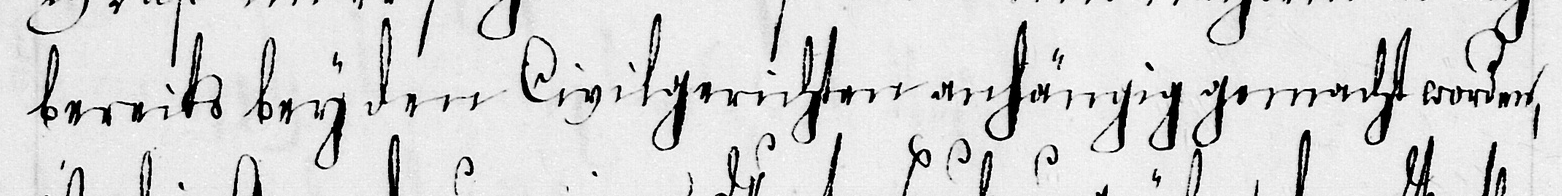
bereits bey den Civilgerichten anhängig gemacht worden,
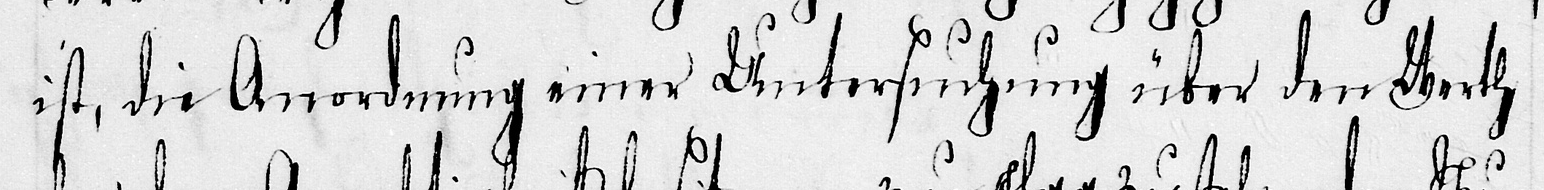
ist, die Anordnung einer Untersuchung über den Werth
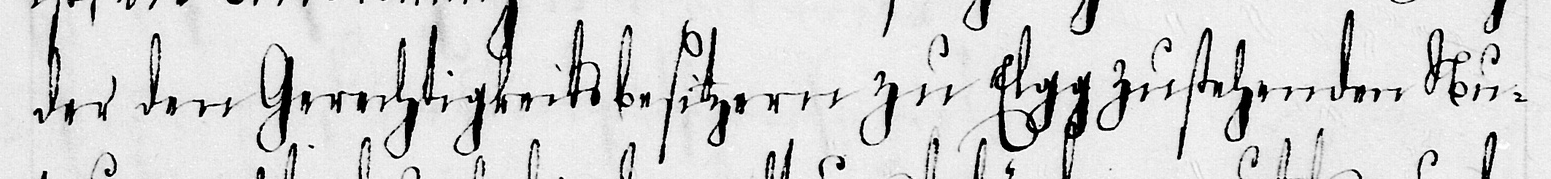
der den Gerechtigkeitsbesitzern zu Elgg zustehenden Nu¬
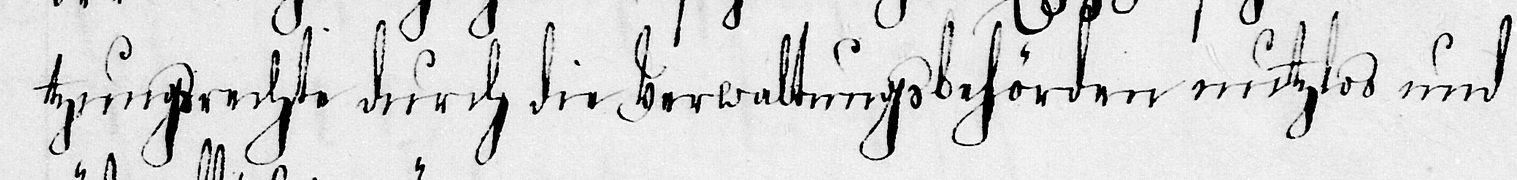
tzungsrechte durch die Verwaltungsbehörden nutzlos und
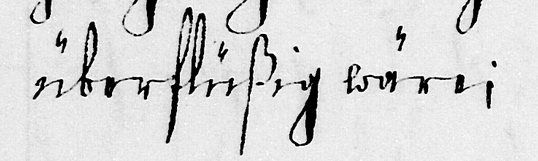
überflüßig wäre;
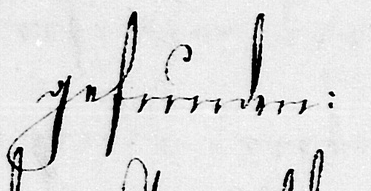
gefunden:
